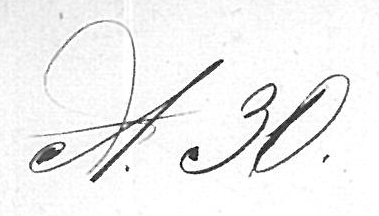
A. 30.
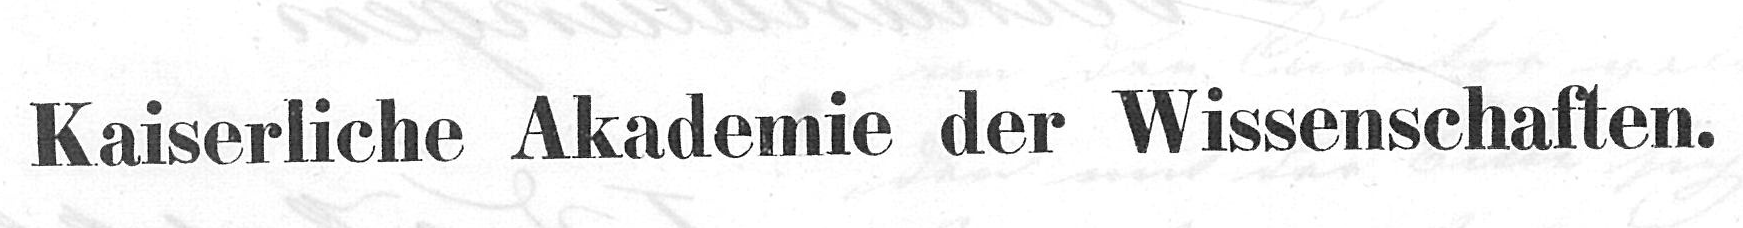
Kaiserliche Akademie der Wissenschaften.
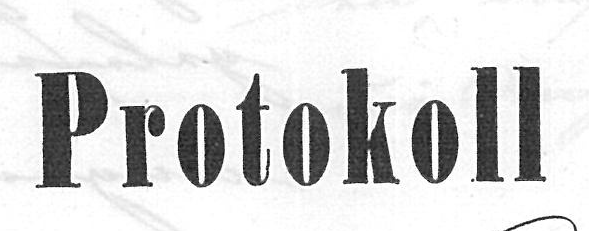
Protokoll
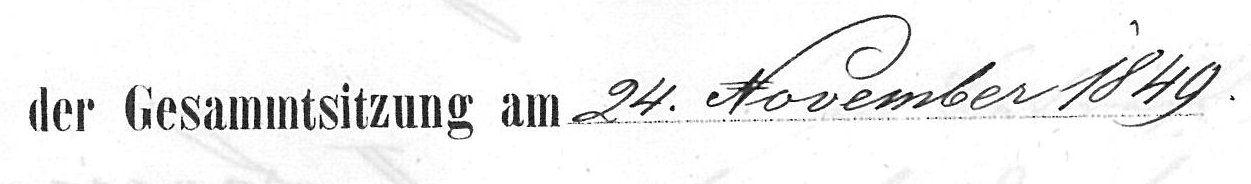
der Gesammtsitzung am 24. November 1849
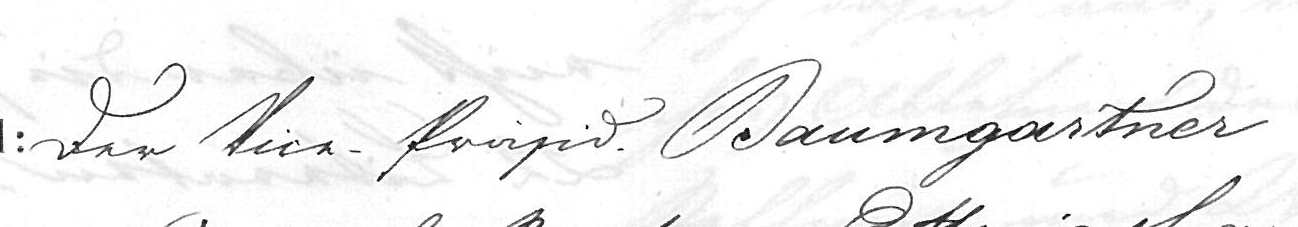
die Vice-Präesid. Baumgartner
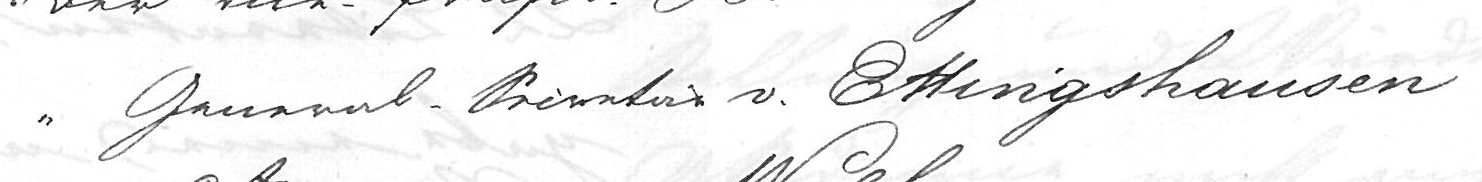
" General-Secretär v. Ettingshausen
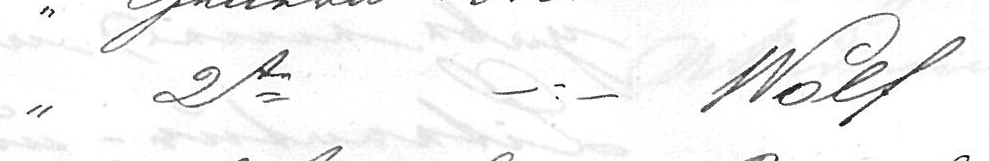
" 2te -"- Wolf
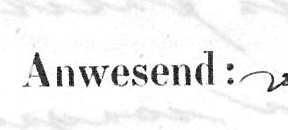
Anwesend:
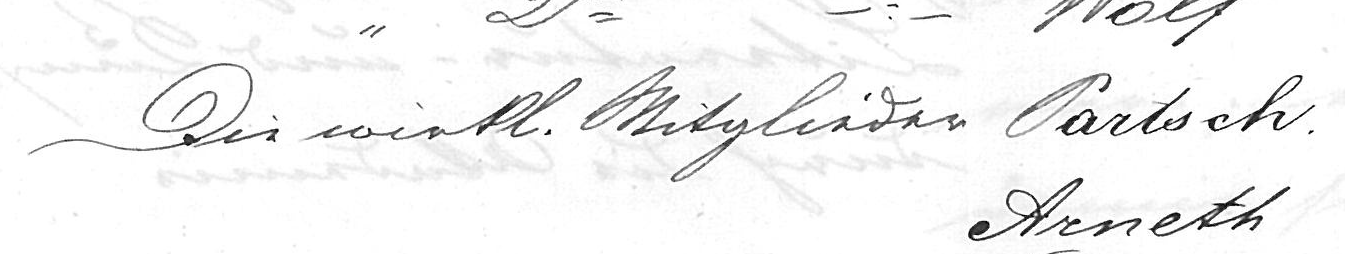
Die wirkl. Mitglieder Partsch
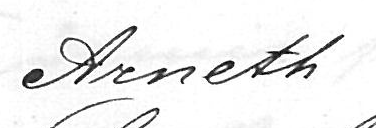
Arneth
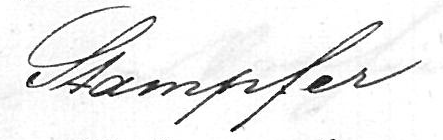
Stampfer
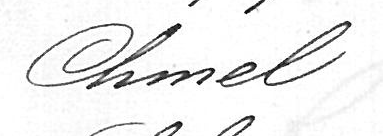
Chmel
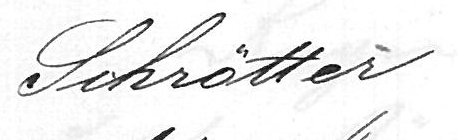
Schrötter
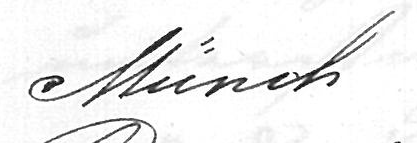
Münch
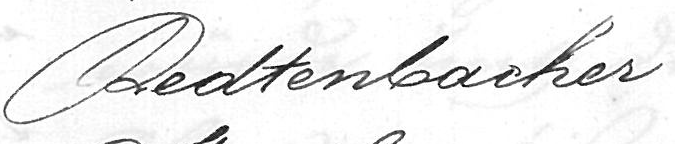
Redtenbacher
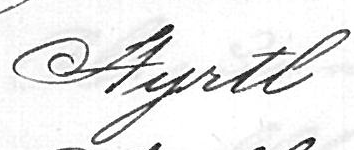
Hyrtl
